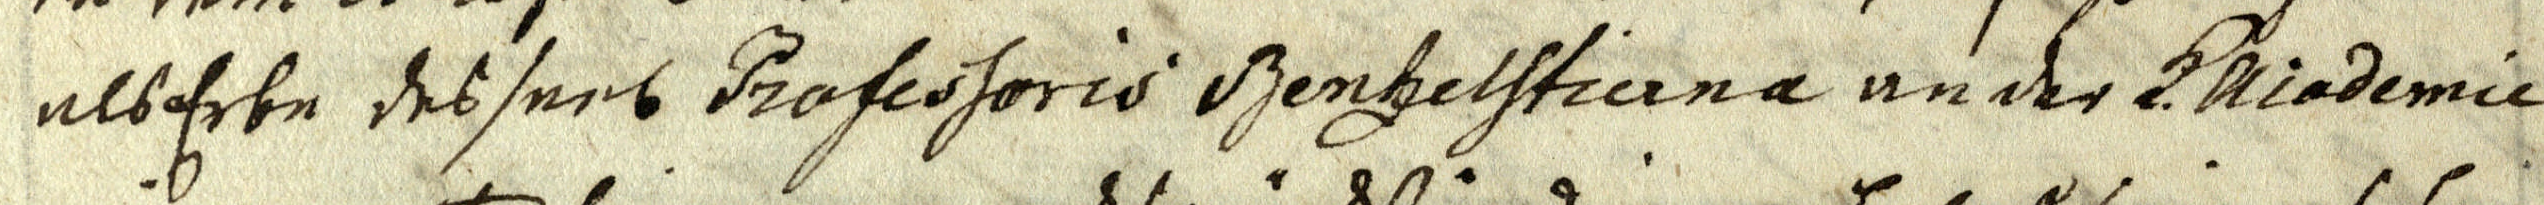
als Erbe des seel. Professoris Bentzelstierna an der K. Academie
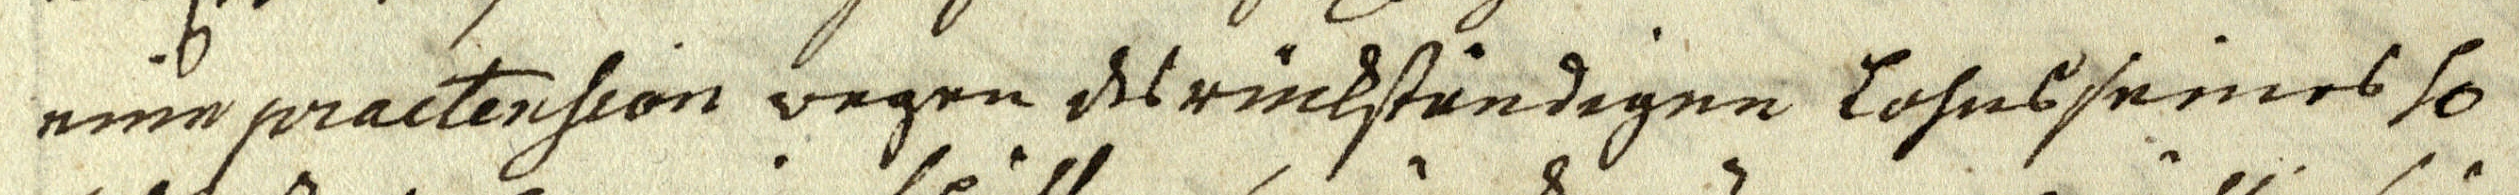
eine praetension wegen des rückständigen Lohns seines H.
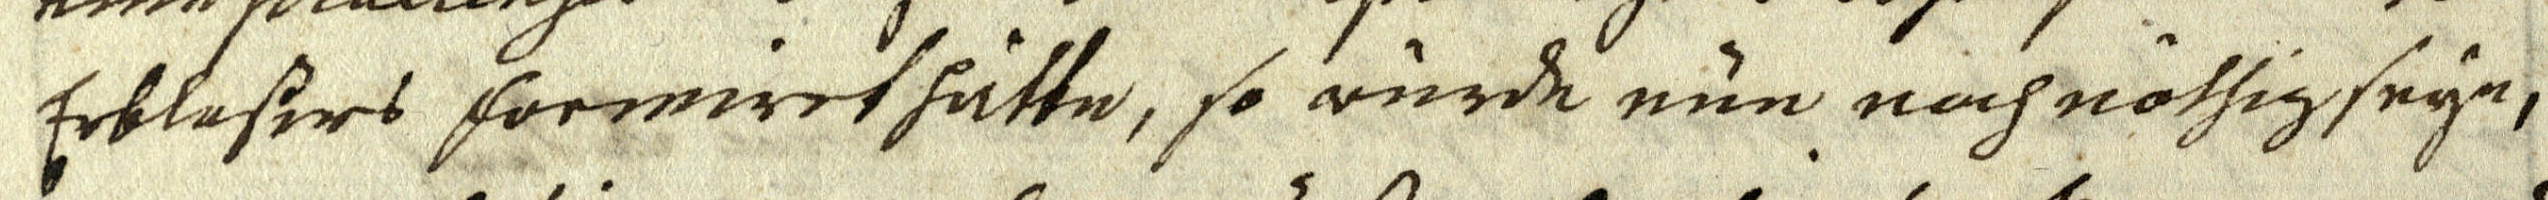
Erblaßers formiret hätte, so würde nun noch nöthig seÿn,
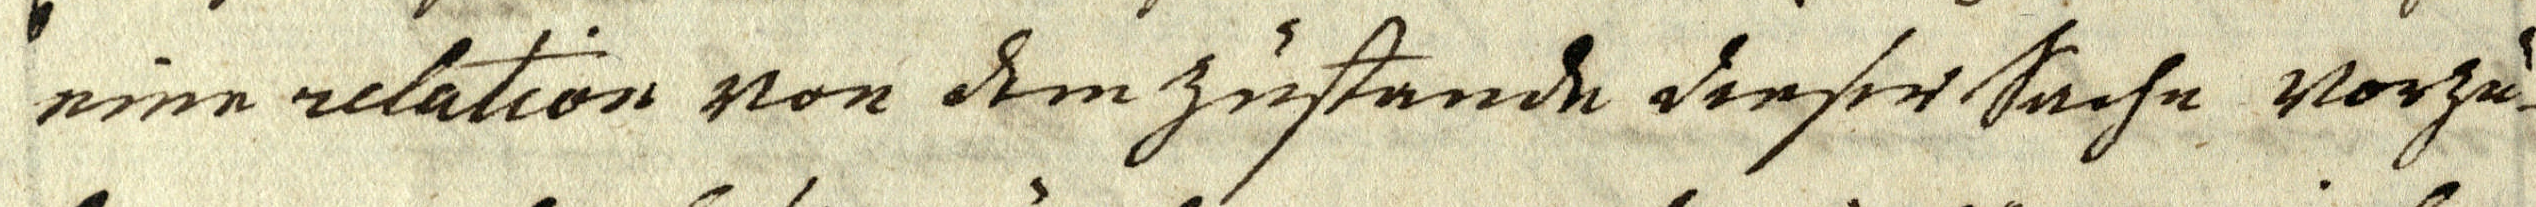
eine relation von dem Zustande dieser Sache vorzu¬
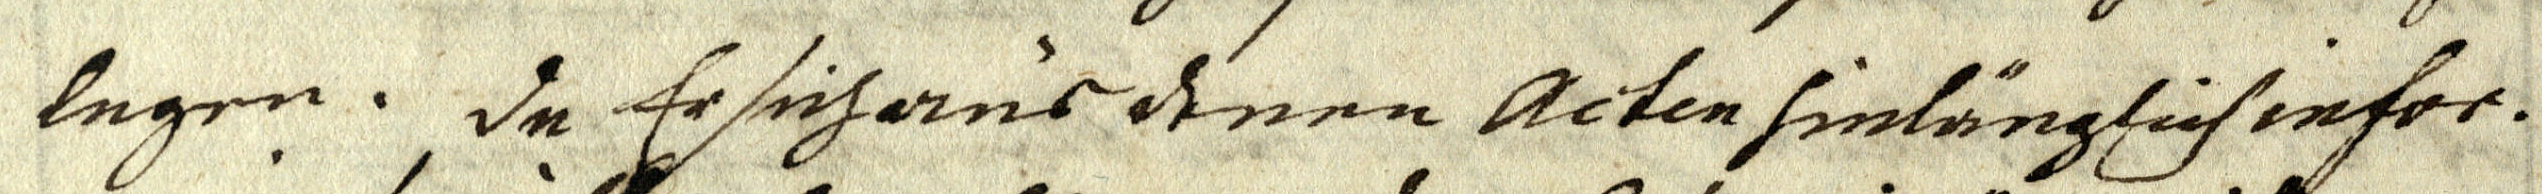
legen. Da Er sich aus denen Acten hinlänglich infor¬
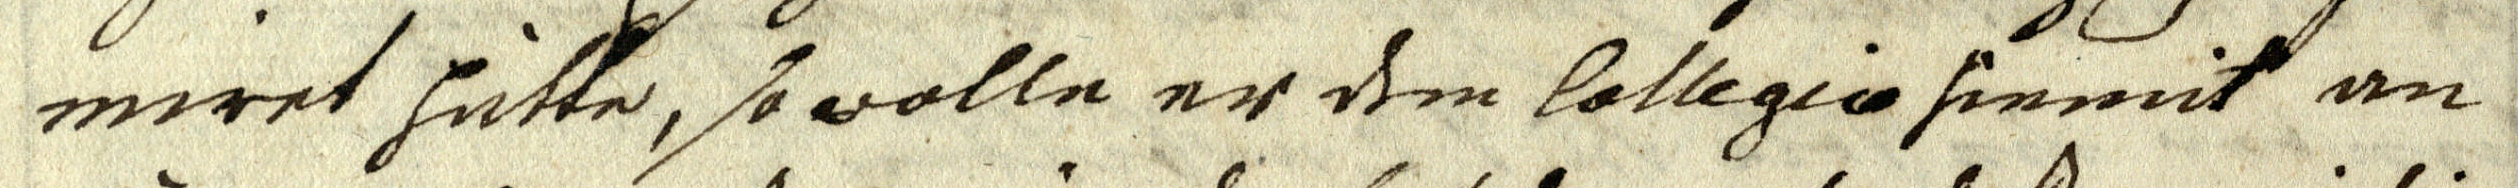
miret hätte, so wolle er dem Collegio hiemit an
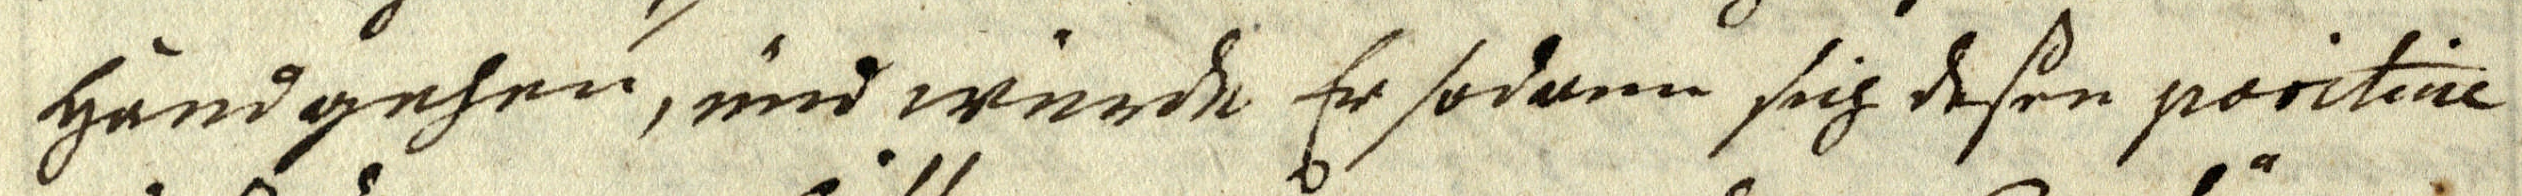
Hand gehen, und würde Er sodann sich deßen positive
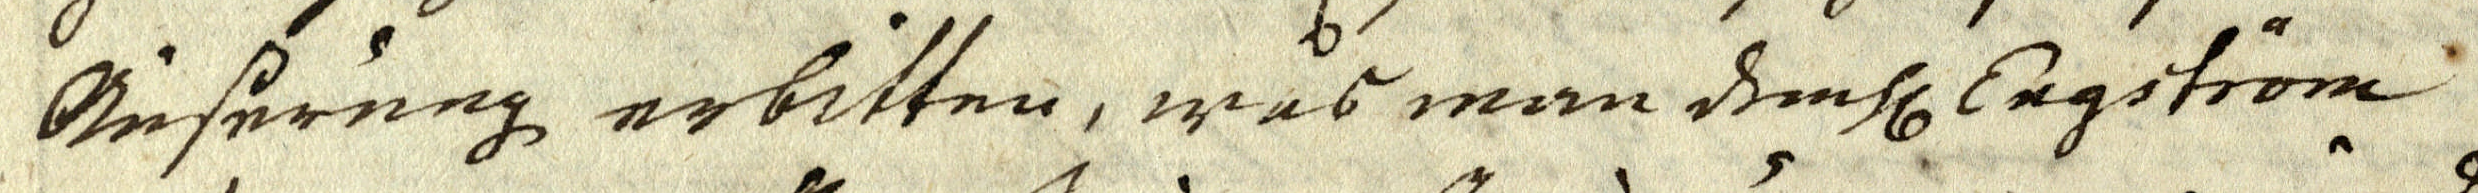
Äußerung erbitten, was man dem H. Engström
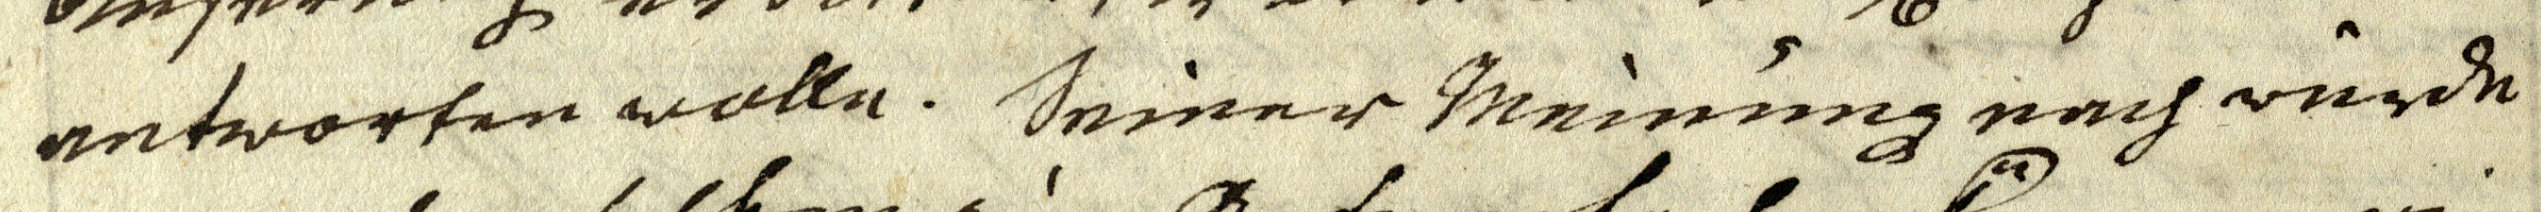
antworten wolle. Seiner Meinung nach würde
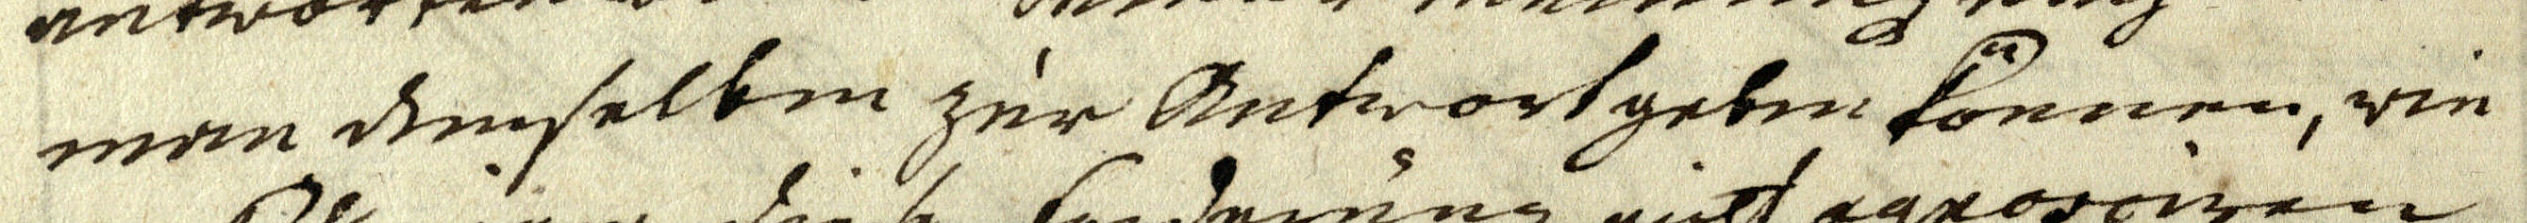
man demselben zur Antwort geben können, wie
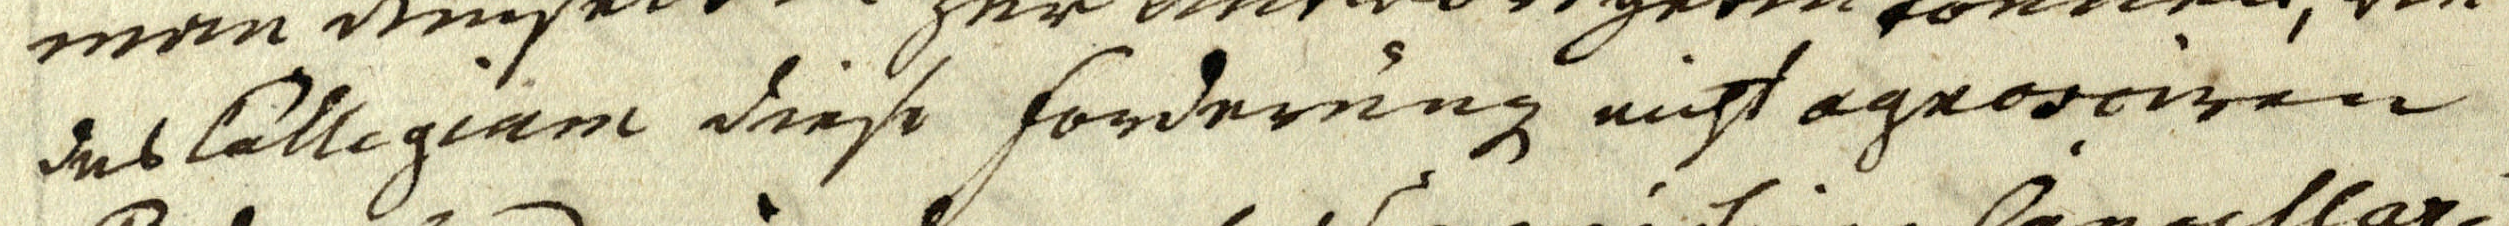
das Collegium diese Forderung nicht agnosciren
